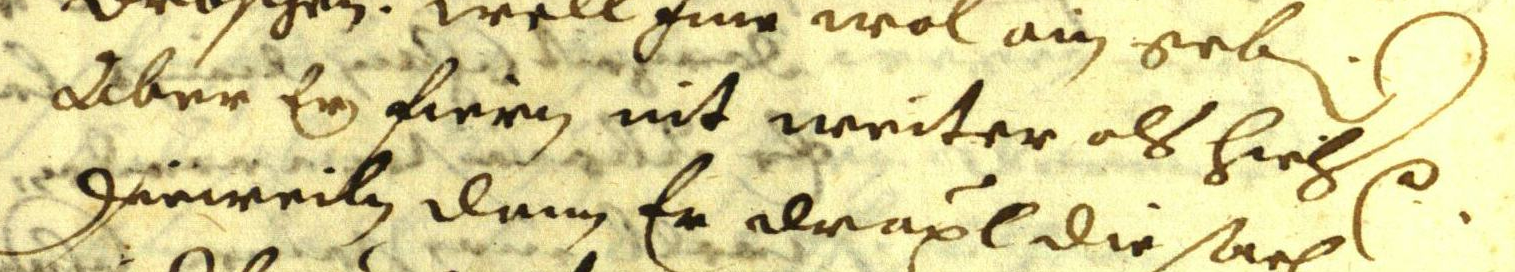Aber Er fiern nit weiter als hieh etc.
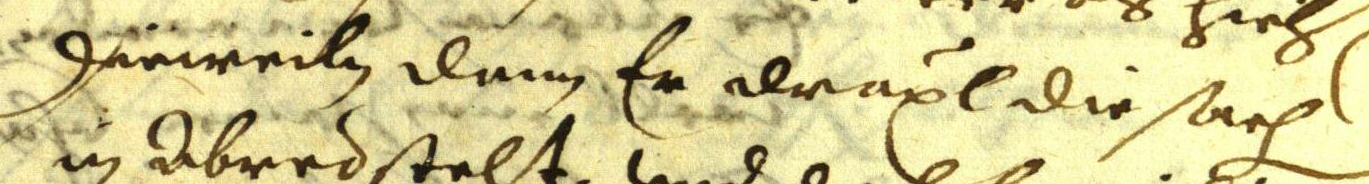Derweiln dann Er drāxl die sach
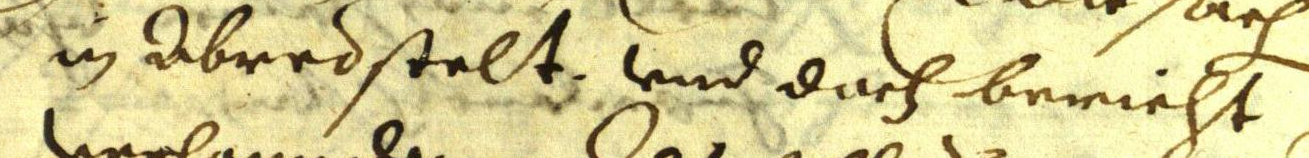in Abred stelt. vnd doch bericht
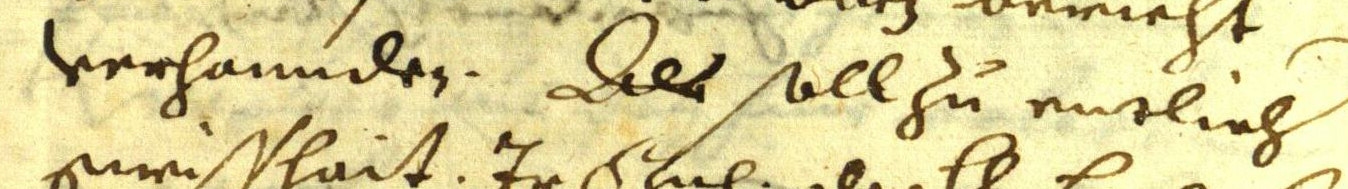verhannden. Als soll Zū entlich
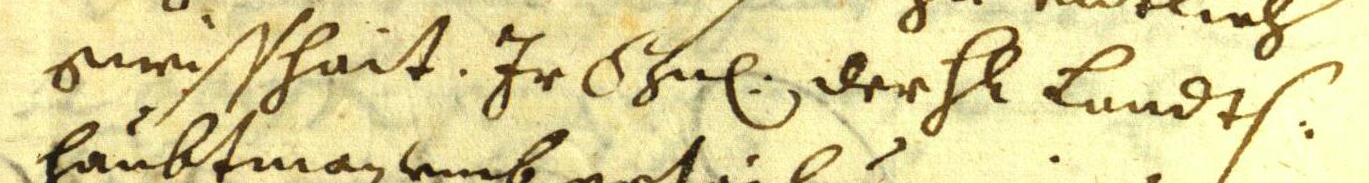gwisshait. Ir Gn: der hl Landts¬
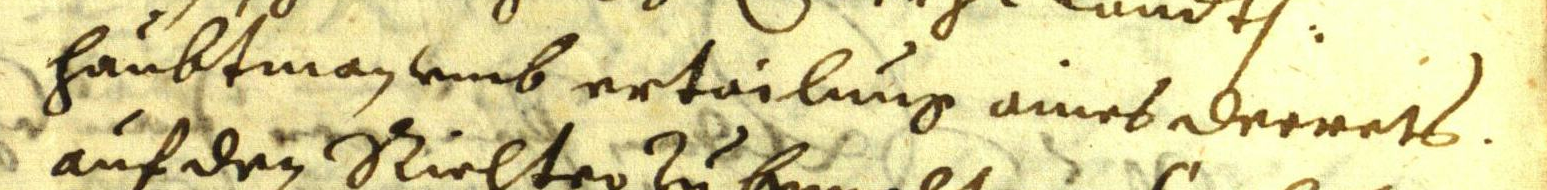haūbtman vmb ertailūng aines decrets.
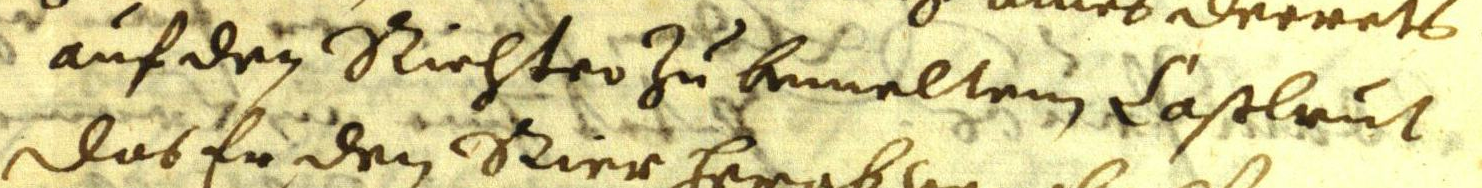aūf den Richter Zū bemeltem Castlrūt
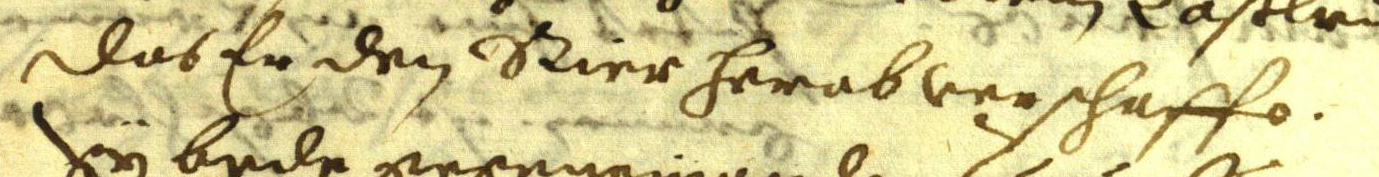das Er den Rier herab verschaffe.
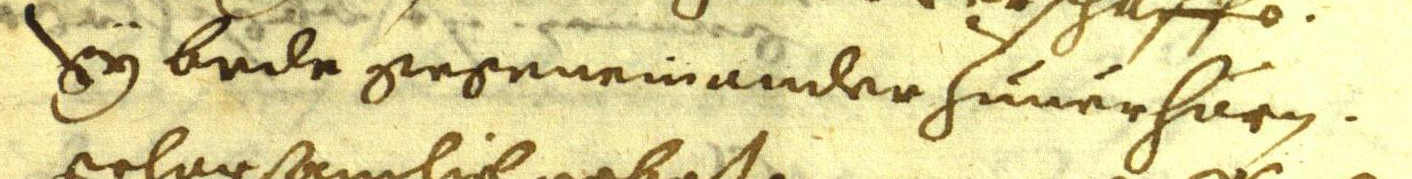Sÿ bede gegeneinander Zūūerhōrn.
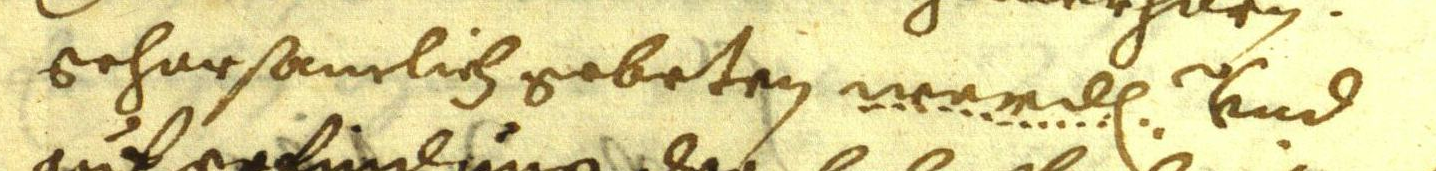gehorsamlich gebeten werd. Vnd
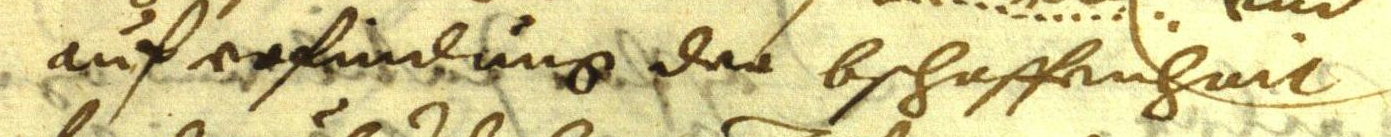aūf erfindūng der beschaffenhait
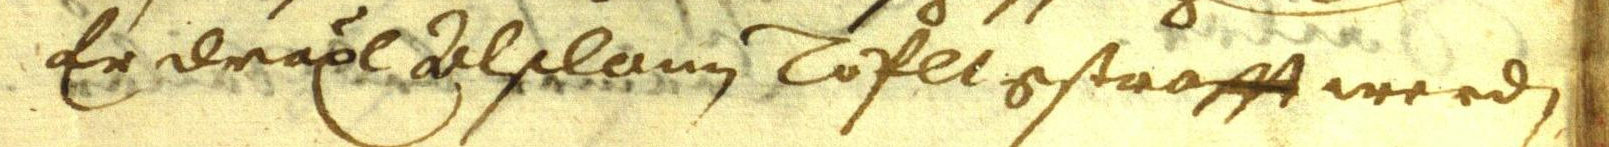Er drāxl Alsdann Toplt gstrafft werd
